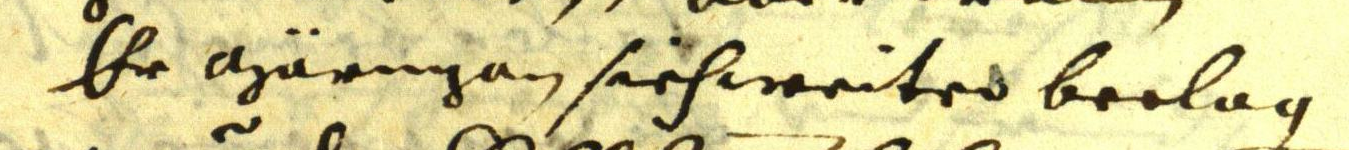Er Märnzan sich weiter beclag
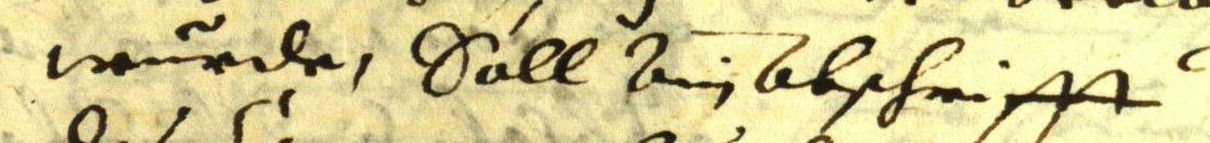wūrde, Soll Ain Abschrifft
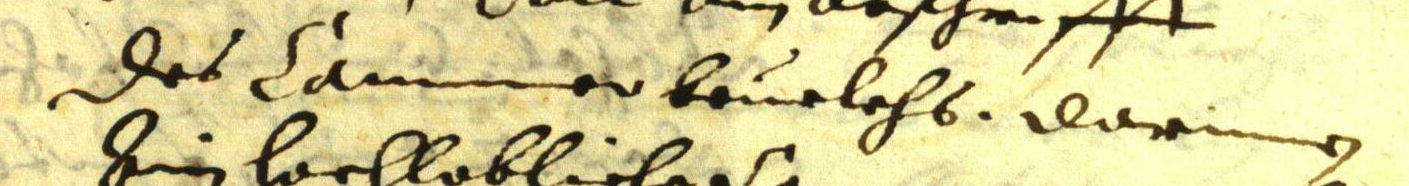des Cammer beūelchs. darinnen
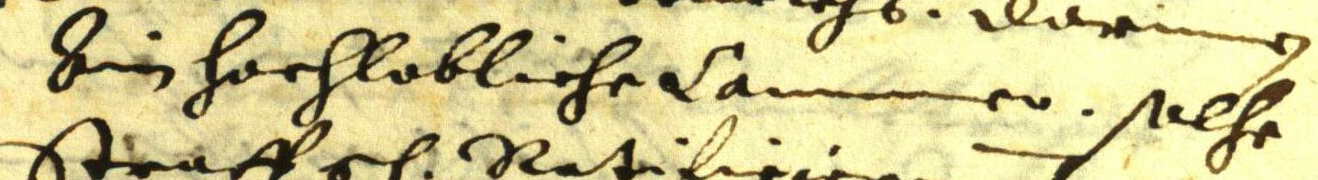Ain hochlobliche Cammer. solhe
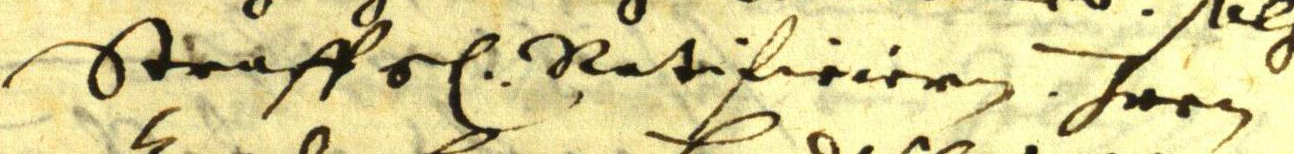Straff g: Ratificiern. Iren
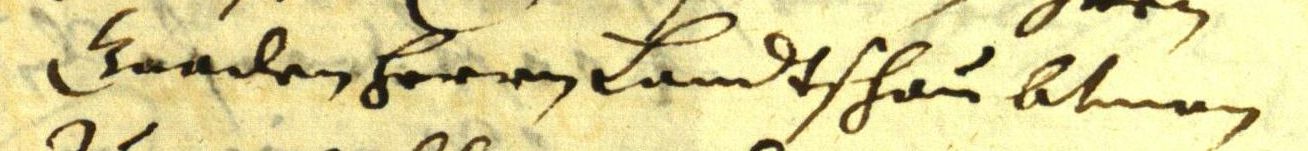Gnaden herrn Landtshaūbtman
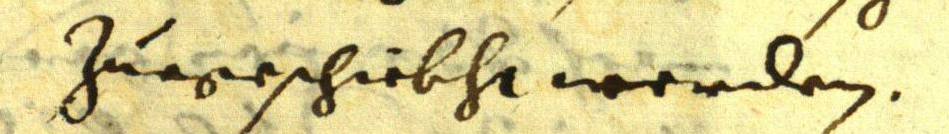Zūegeschickht werden.
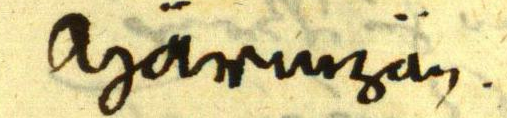Märnzän.
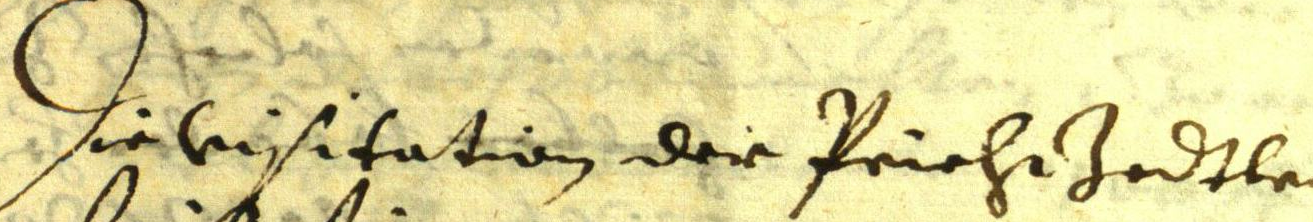Die Visitation der Peicht Zedtlen
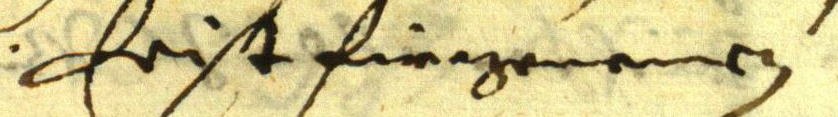Eeist firzenemen.
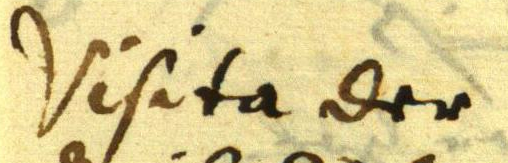Visita der
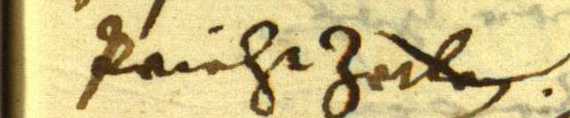Peicht Zetlen.
